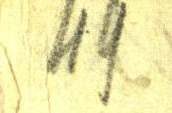49
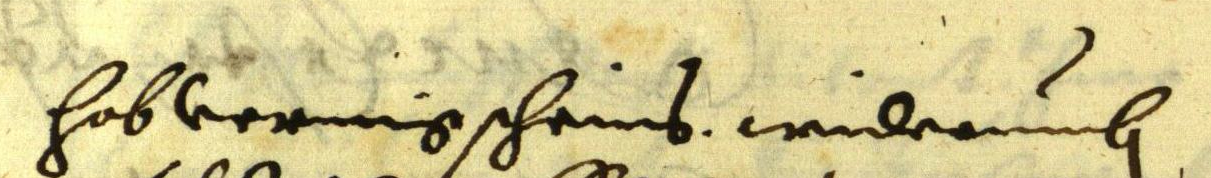hab vermig scheins. widerūmb
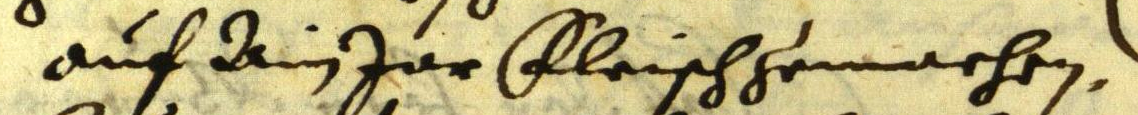aūf Ain Jar Fleisch Zemachen.
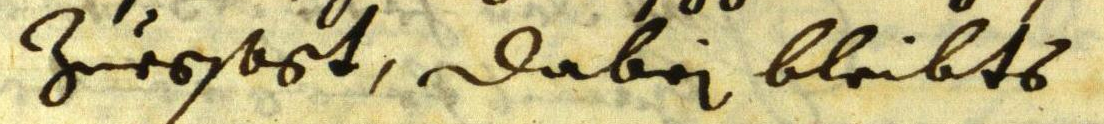Zūegsagt, dabej bleibts
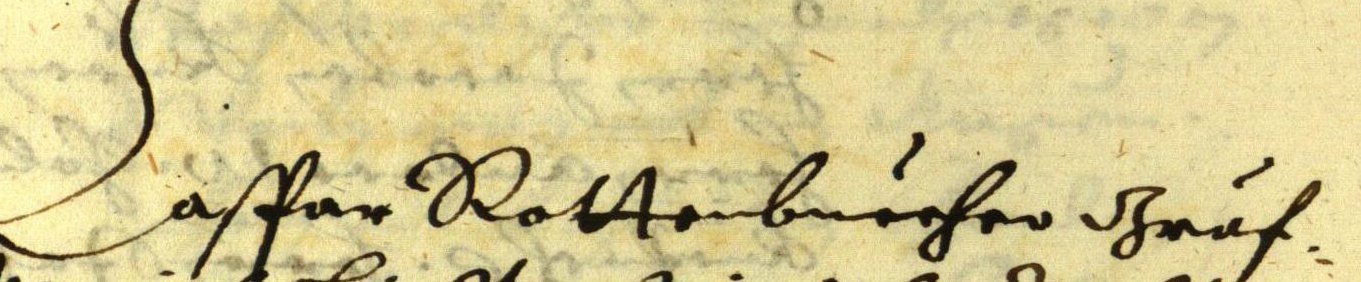Caspar Rottenbūecher Grāf¬
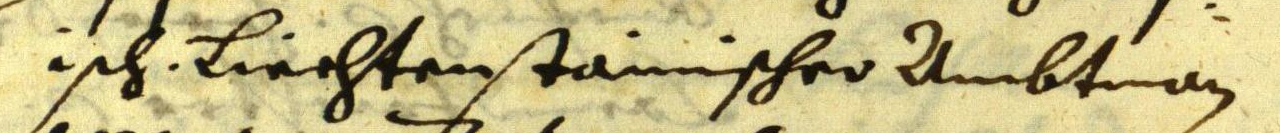isch. Liechtenstainischer Ambtman
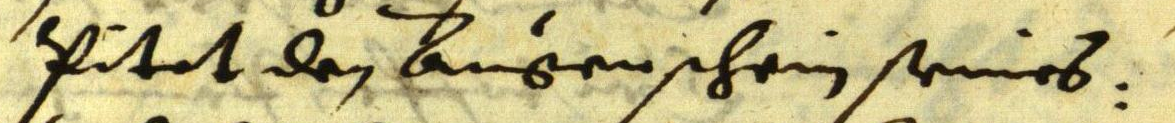Pitet den Aūgenschein seines¬
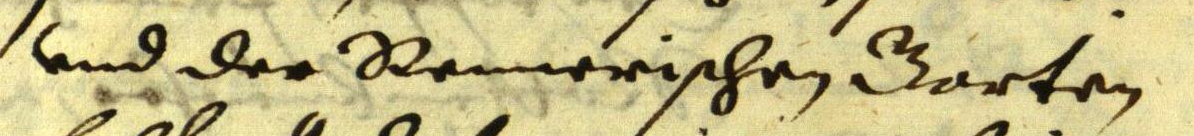vnd der Rennerischen Garten
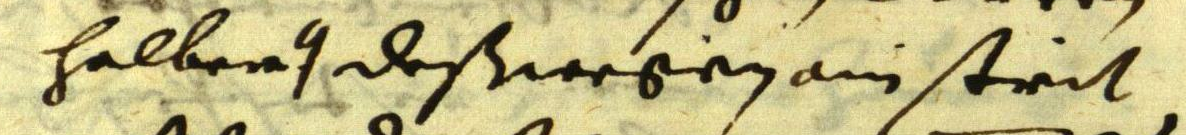halber deßwegen ain streit
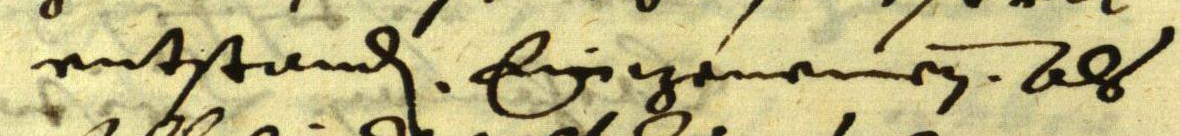entstand. Einzenemen. Als
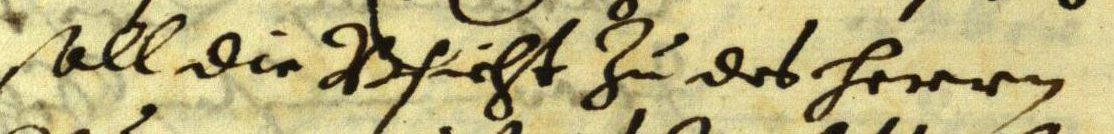soll die Bsicht Zū des herrn
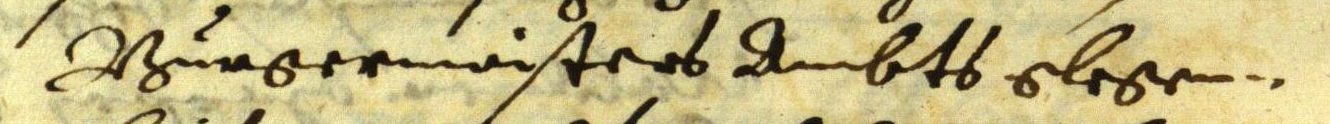Būrgermaisters Ambts glegen¬
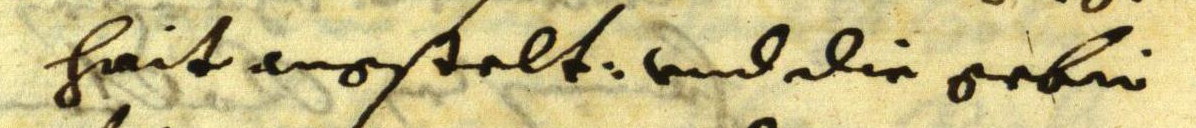hait angestelt: vnd die gebir
